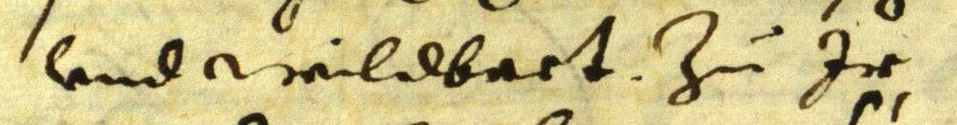vnd wildbret. Zū Ir
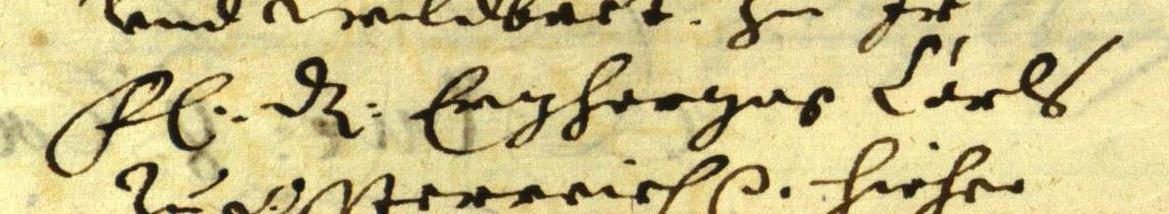Fl: dt: Erzherzog Carls
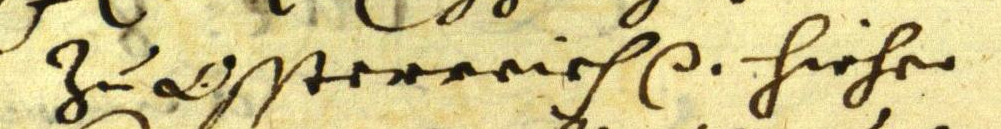Zū Ossterreich etc. hieher
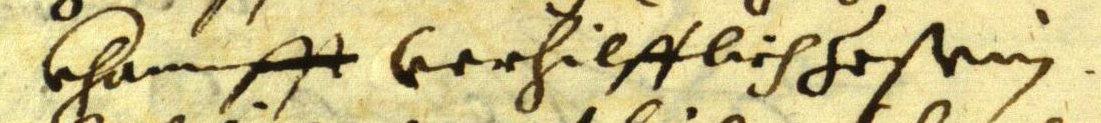khonnfft verhilfflich Zesein.
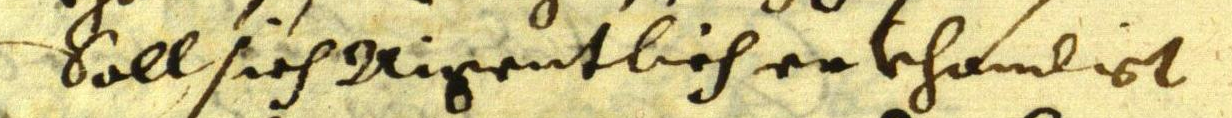Soll sich Aigentlich erkhondigt
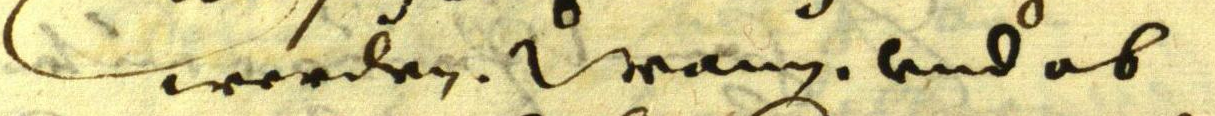werden. Wann. vnd ob
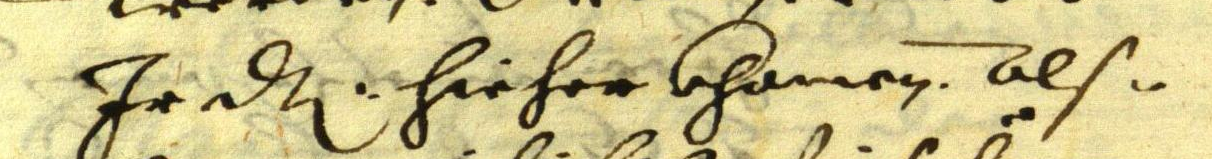Ir dt: hieher khomen. Als¬
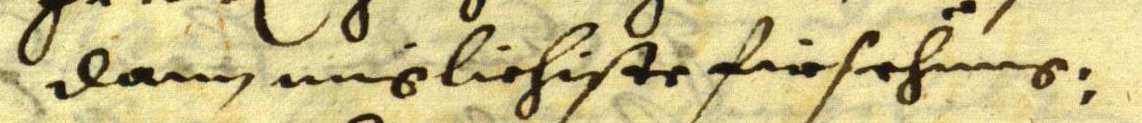dann miglichste firsehūng¬
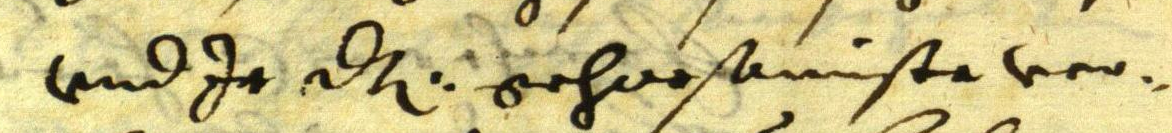vnd Ir dt: gehorsamiste ver¬
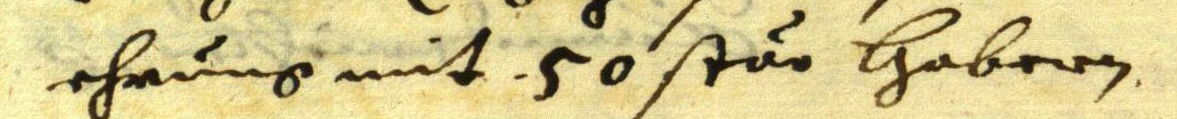ehrūng mit .50 Stār Habern
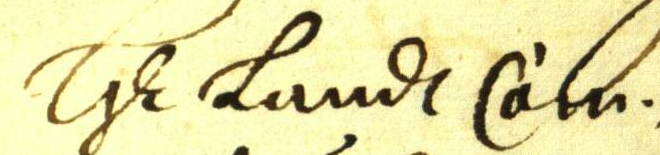Hl Landt Com¬
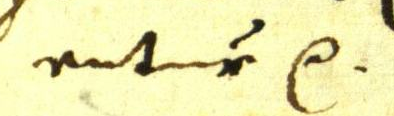entūr etc.
